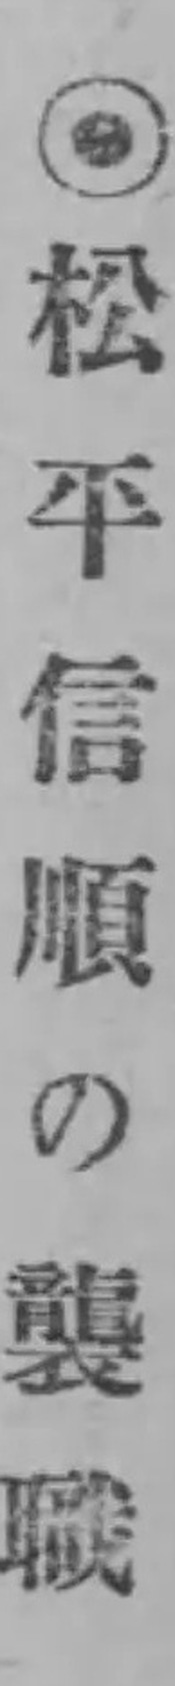⦿松平信順の襲職
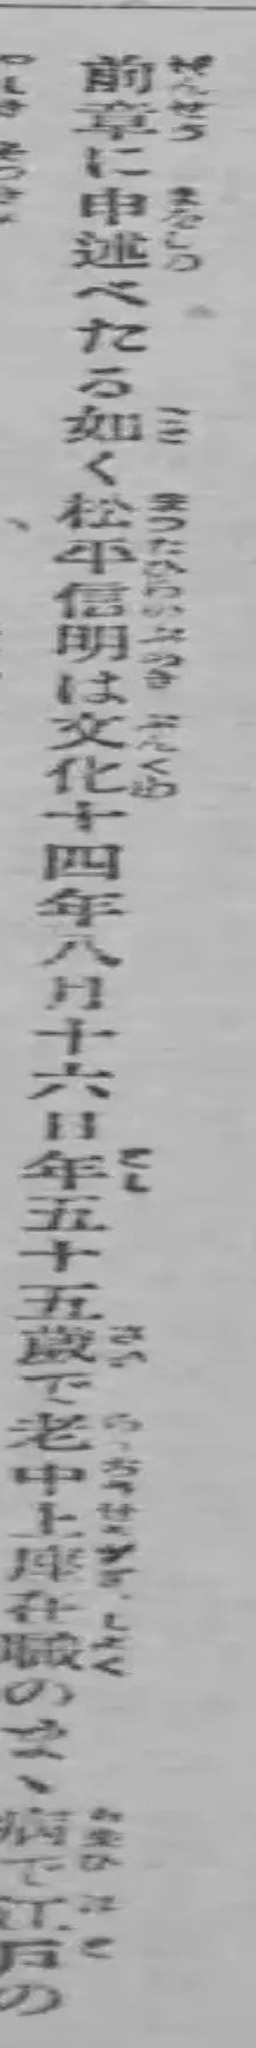前章に申述べたる如く松平信明は文化十四年八月十六日年五十五歳で老中上座在職のまゝ病で江戸の
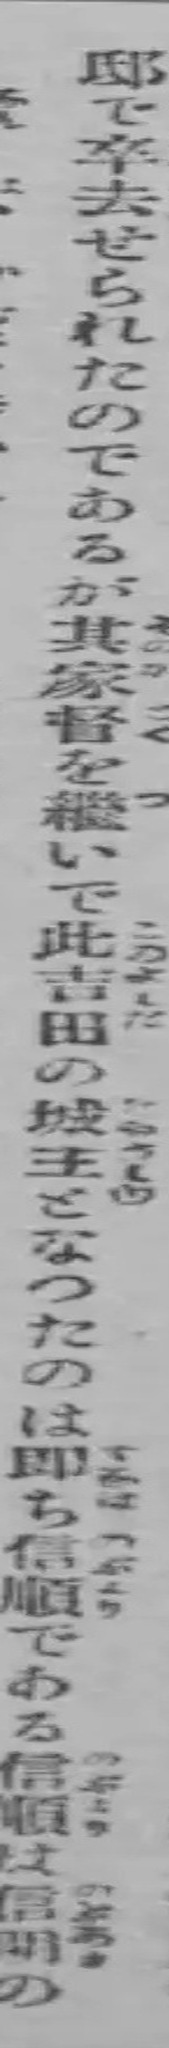松平信順邸で卒去せられたのであるが其家督を継いで此吉田の城主となつたのは即ち信順である信順は信明の
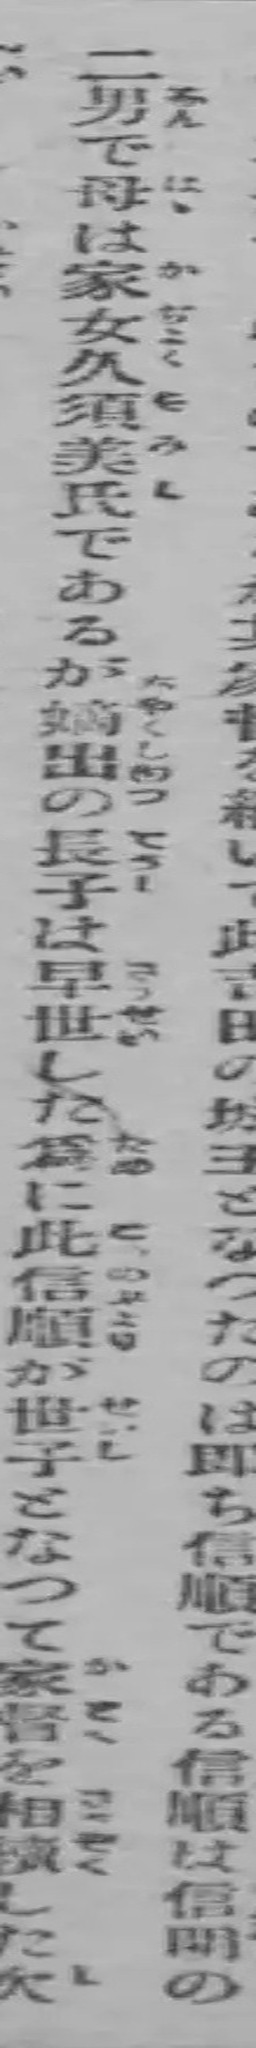二男で母は家女久須美氏であるが嫡出の長子は早世した為に此信順が世子となつて家督を相続した次
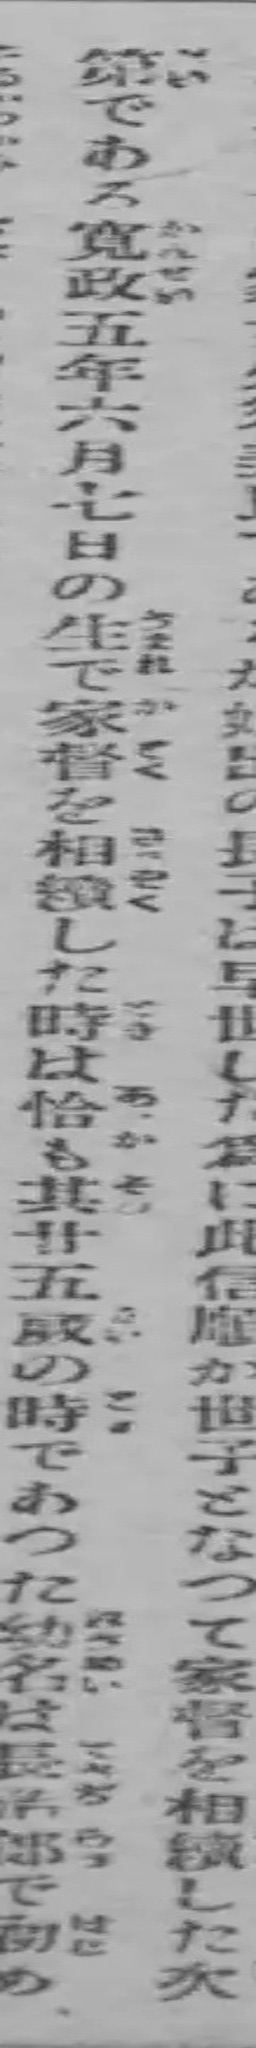第である寛政五年六月七日の生で家督を相続した時は恰も其廿五歳の時であつた幼名は長治郎で初め
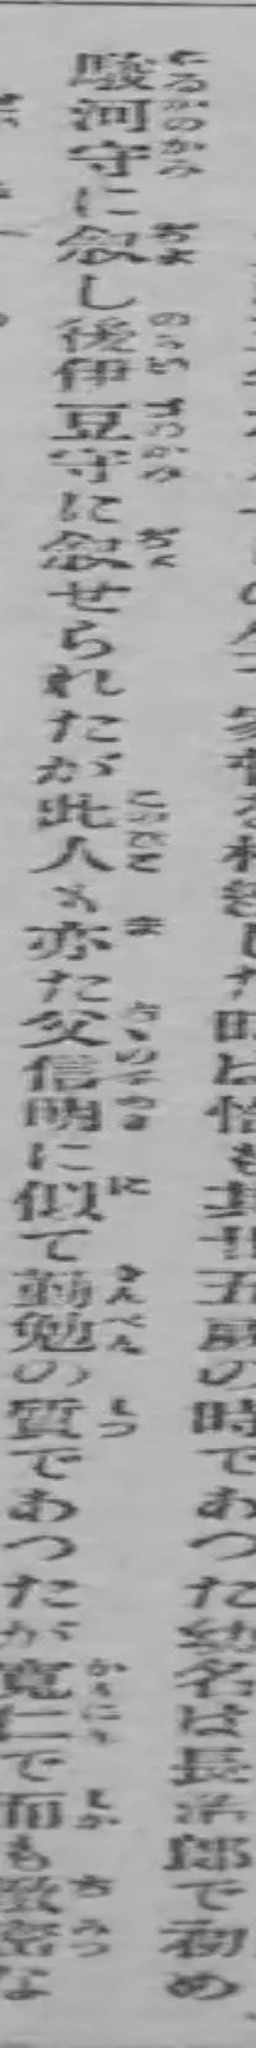駿河守に叙し後伊豆守に叙せられたが此人も亦た父信明に似て勤勉の質であつたが寛仁で而も緻密な
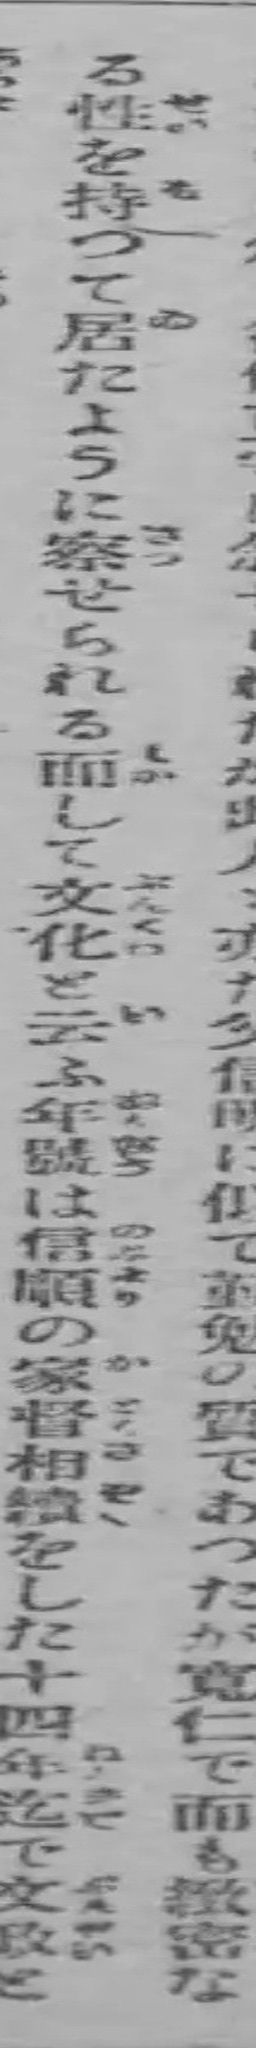る性を持つて居たように察せられる而して文化と云ふ年号は信順の家督相続をした十四年迄で文政と
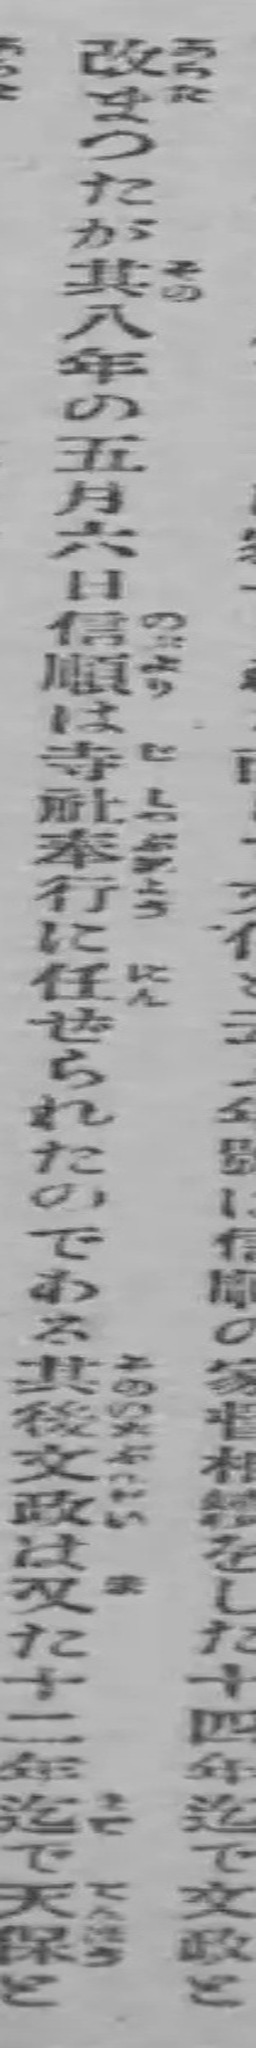改まつたが其八年の五月六日信順は寺社奉行に任ぜられたのである其後文政は又た十二年迄で天保と
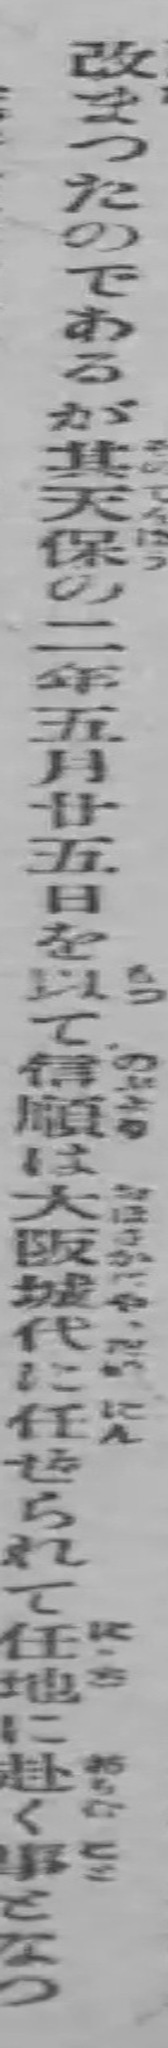改まつたのであるが其天保の二年五月廿五日を以て信順は大阪城代に任ぜられて任地に赴く事となつ
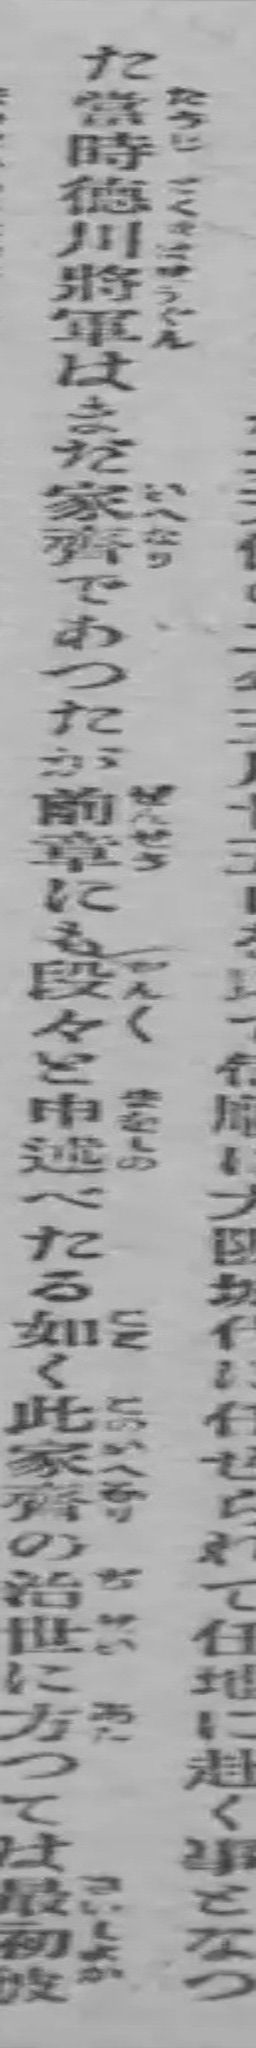た当時徳川将軍はまだ家斉であつが前章にも段々と申述べたる如く此家斉の治世に方つては最初彼
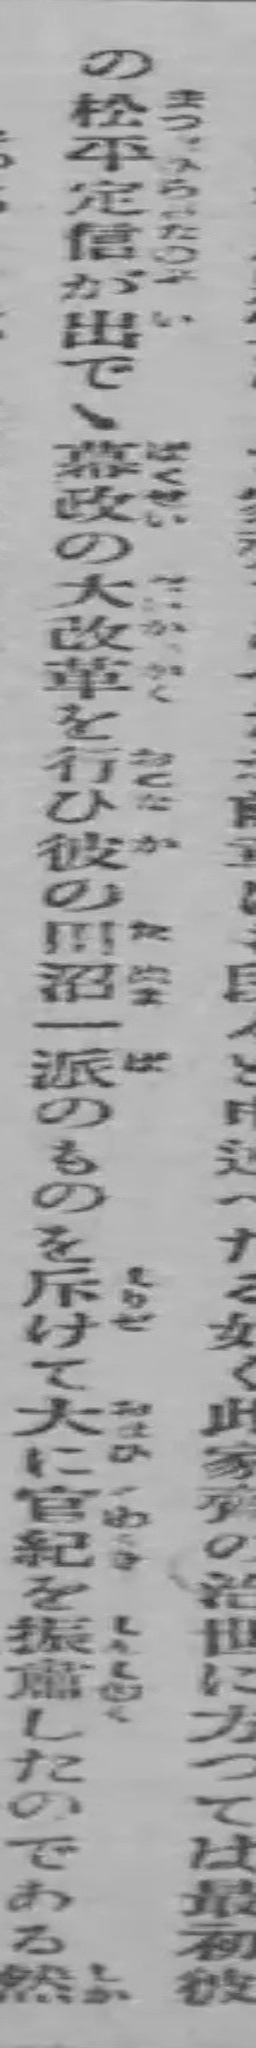の松平定信が出でゝ幕政の大改革を行ひ彼の田沼一派のものを斥けて大に官紀を振粛したのである然
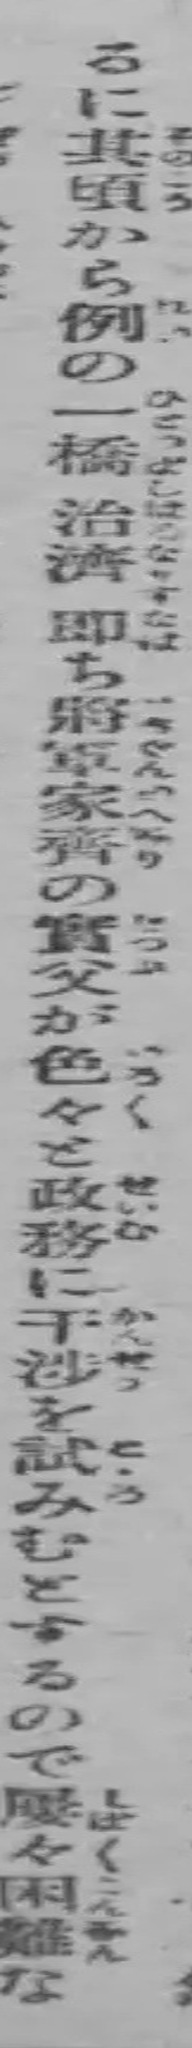るに其頃から例の一橋治済即ち将軍家斉の実父が色々と政務に干渉を試みむとするので屡々困難な
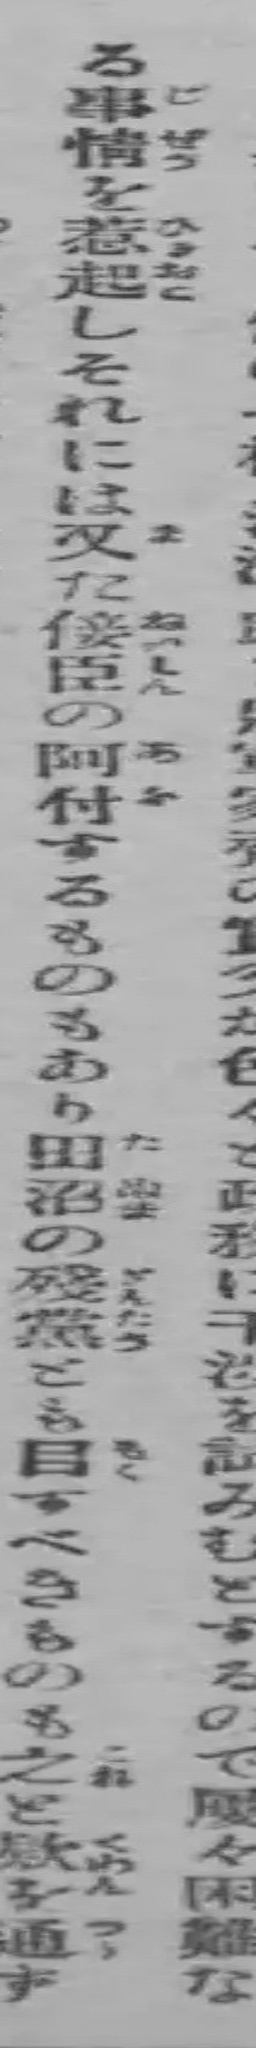る事情を惹起しそれには又た佞臣の阿付するものもあり田沼の残党とも目すべきものも之と欵を通ず
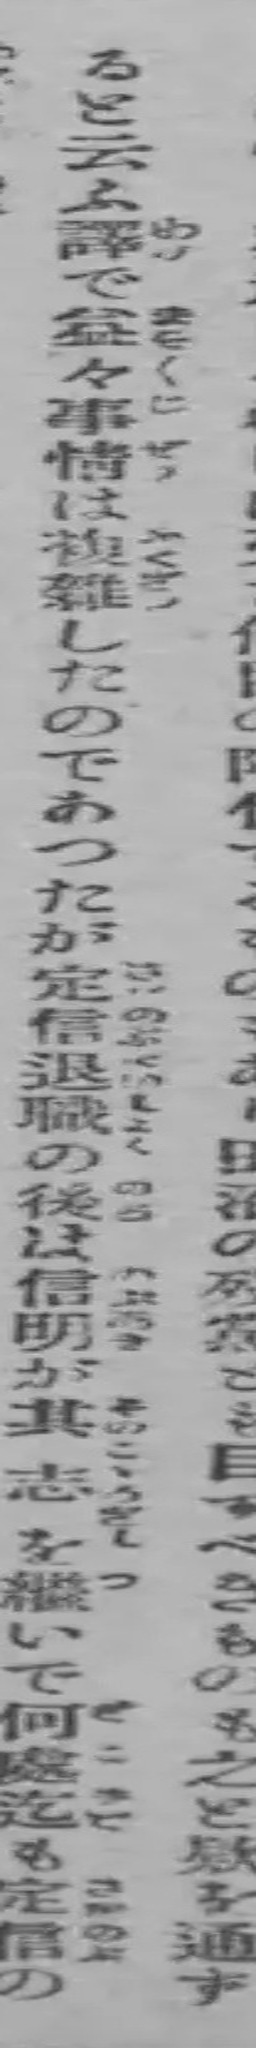ると云ふ訳で益々事情は複雑したのであつたが定信退職の後は信明が其志を継いで何処迄も定信の
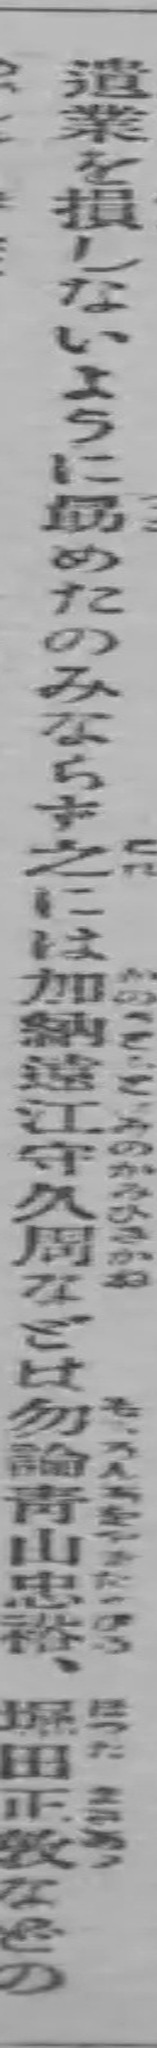遺業を損しないように勗めたのみならず之には加納遠江守久周などは勿論青山忠裕、堀田正敦などの
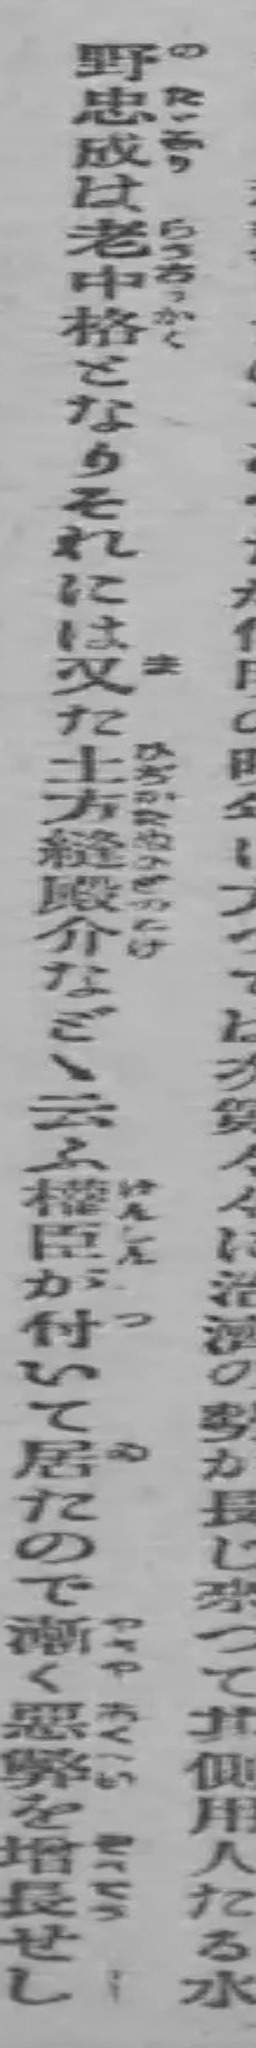野忠成は老中格となりそれには又た土方縫殿介などゝ云ふ権臣が付いて居たので漸く悪弊を増長せし
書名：豊橋市史談
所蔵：国立国会図書館 National Diet Library, JAPAN
